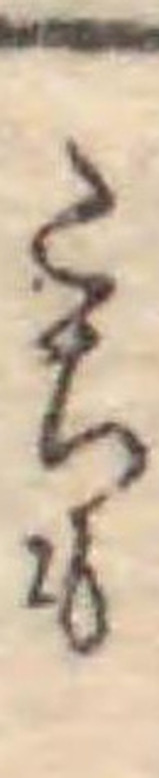こちも
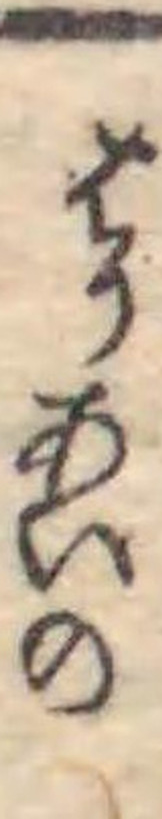はりあいの
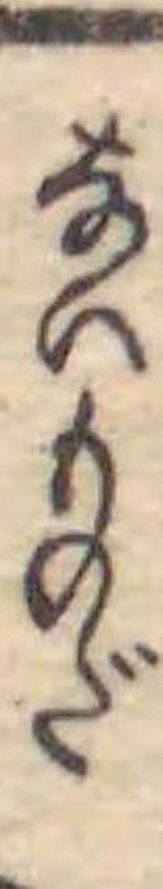ないものだ

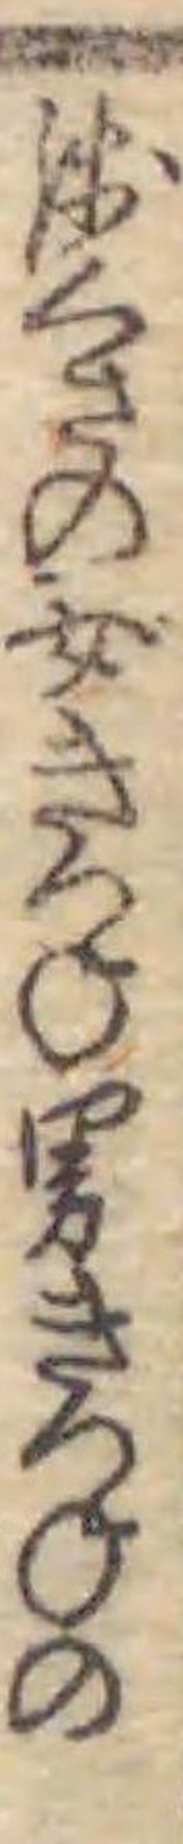浅くさの女きつね男きつねの
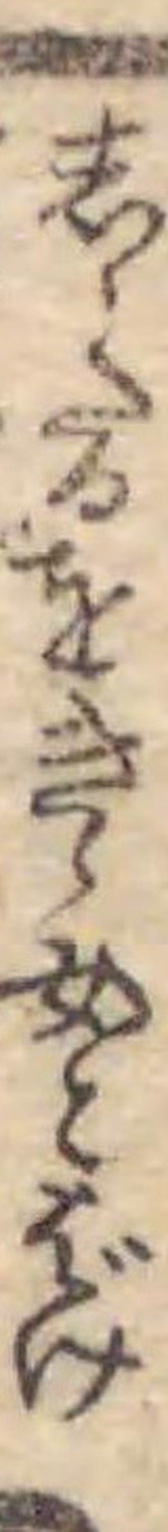しゝたるをきゝ女とばけ
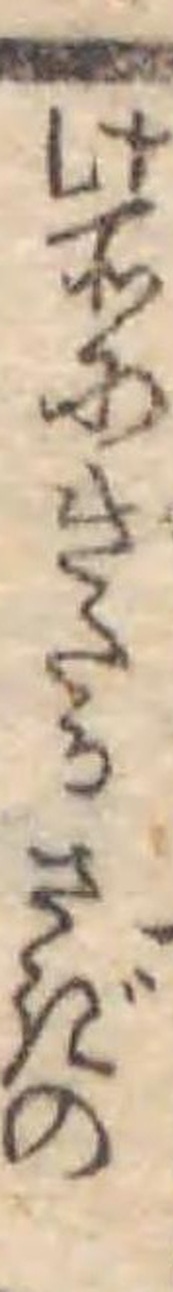此所にきたるさぎの
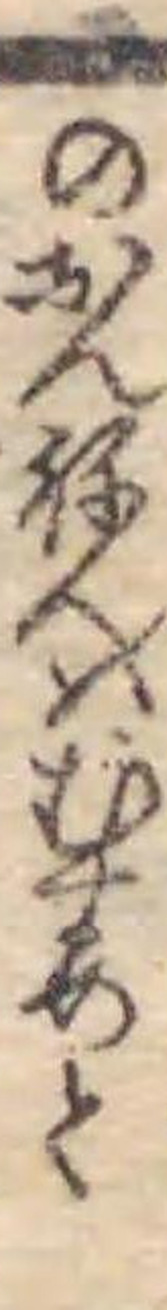おんねんはむすめと
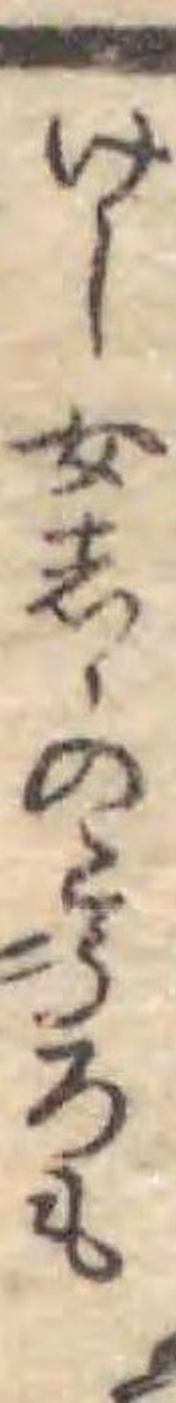けし女しゝのこうろも
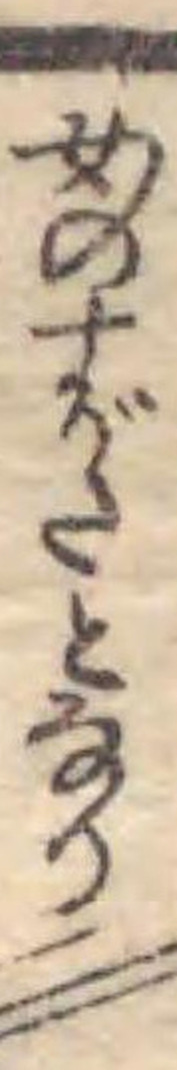女のすがたとなり
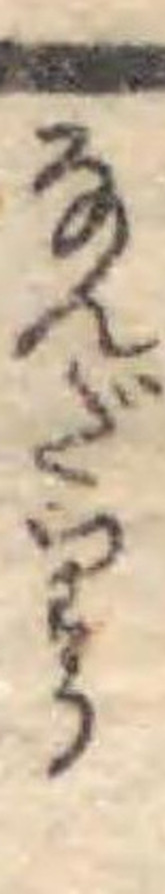なんだりう
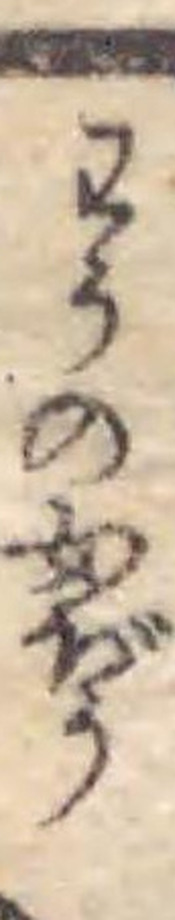わうの女ぼう
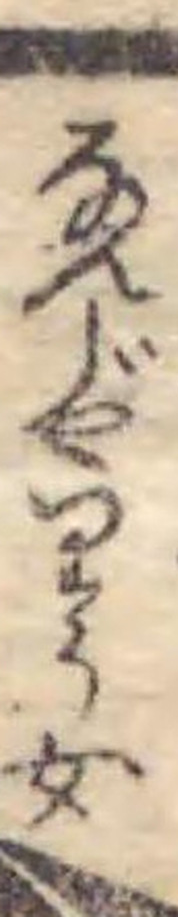なんじやりう女
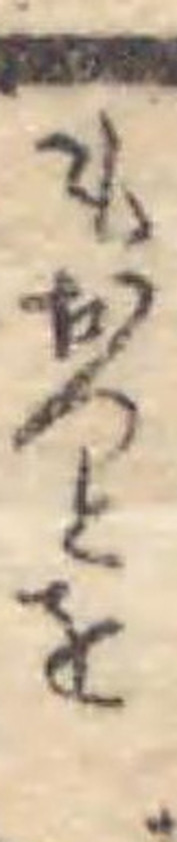もおつとを
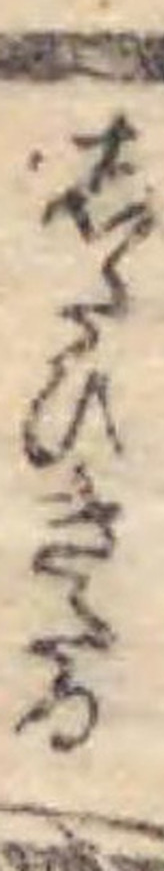したひきたる
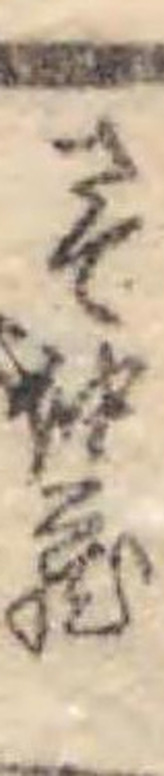さて仲蔵
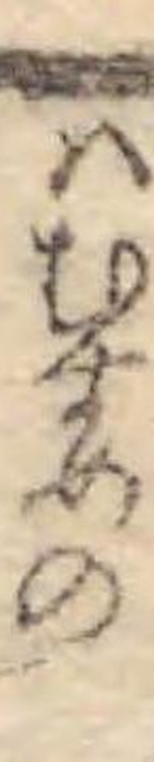はむすめの
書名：鐘入七人化粧 : 3巻
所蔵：国立国会図書館 National Diet Library, JAPAN
